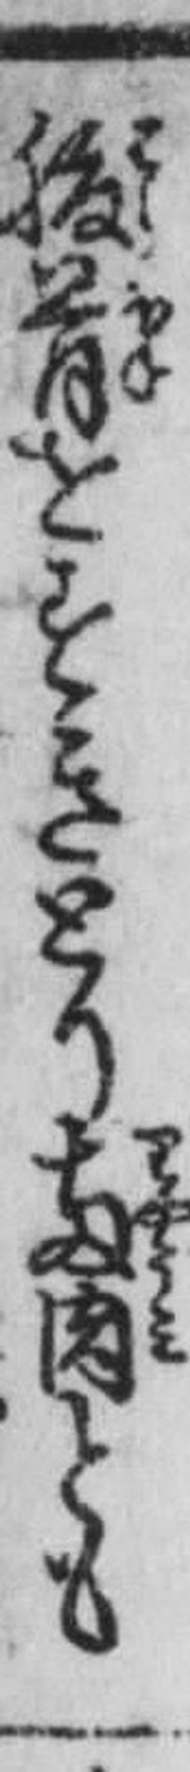腹骨をすきとり両肉とも
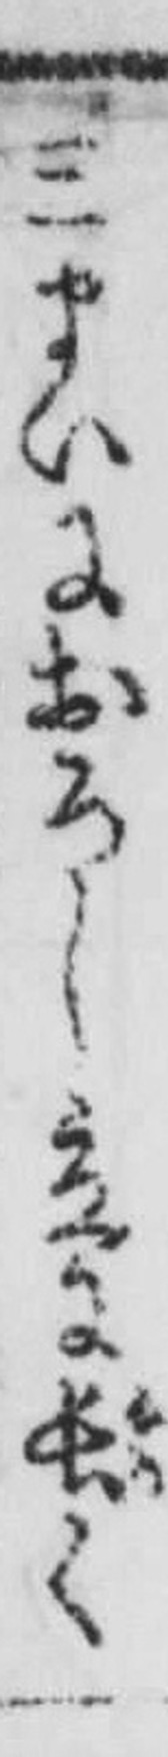三まいにおろし立に長く
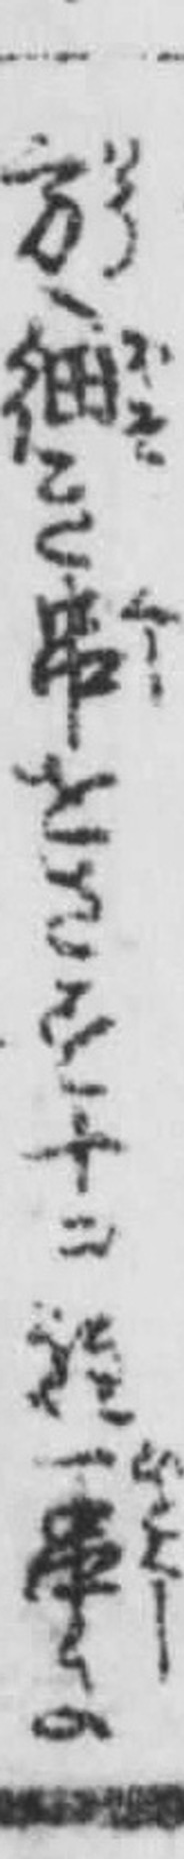方へ細き串をさす十二程一串に
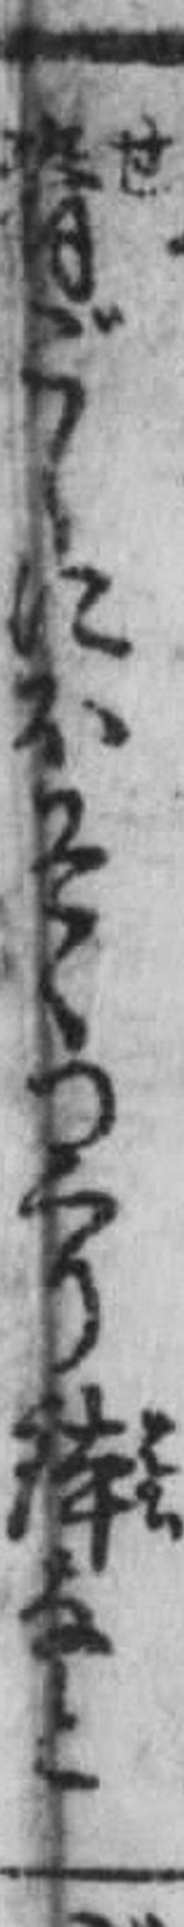背ごしにほそくつくり鉢なと
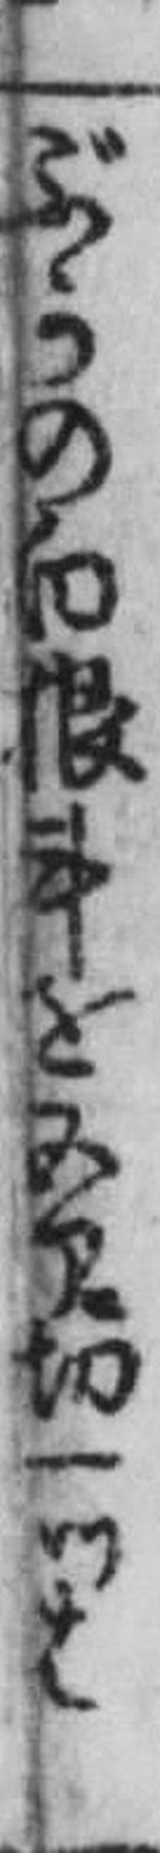ぶかの白根斗を五部に切一つは
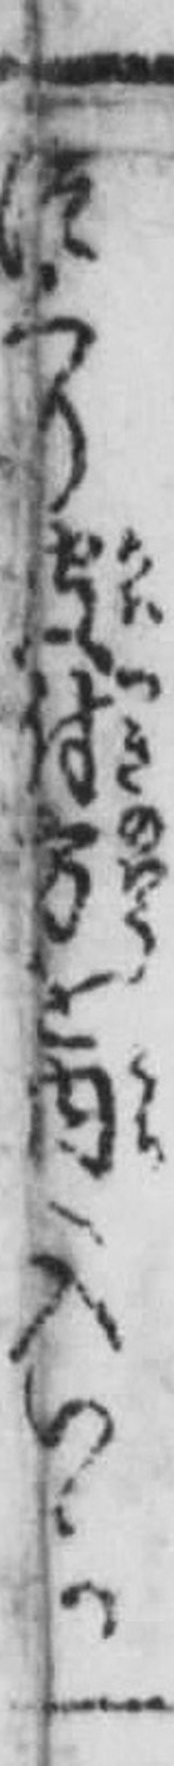つくり皮付方を内へ入いか
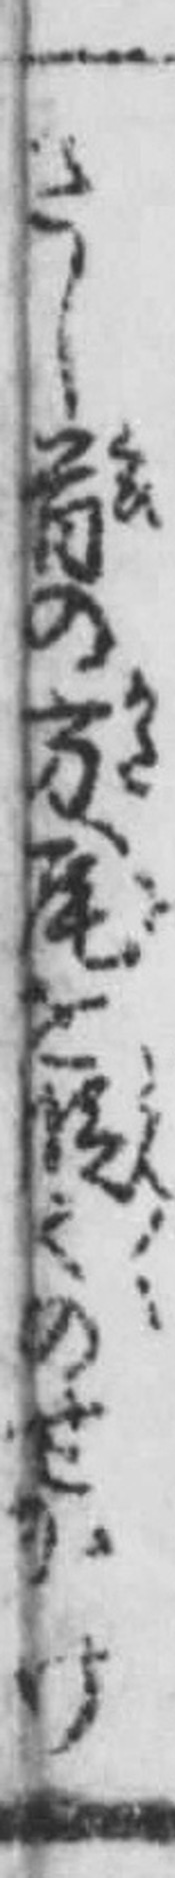さし首の方へ尾を段々のせかけ
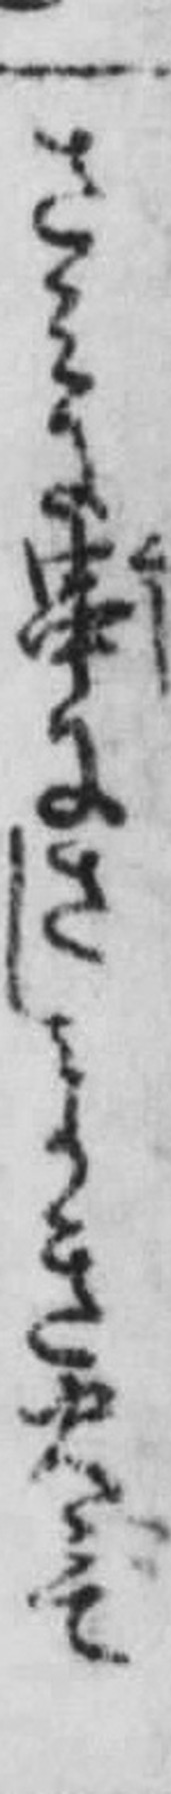さみに串にさしつよき火にて
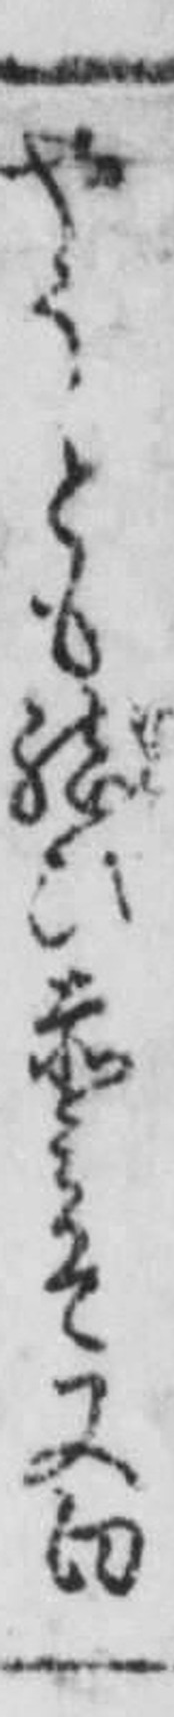やうとも結ひ赤みそ又白
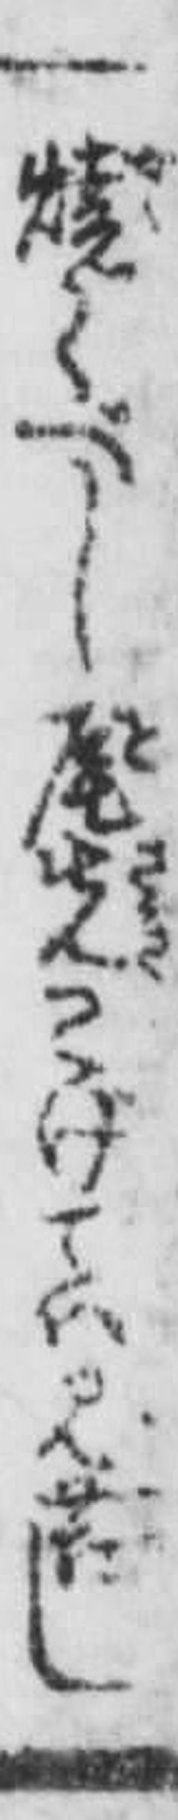焼くべし尾先こげては見苦し
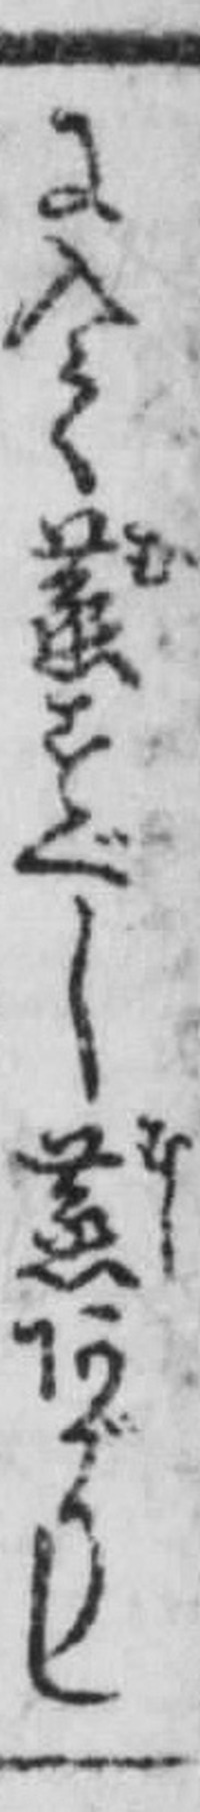に入て蒸すべし蒸あがりし
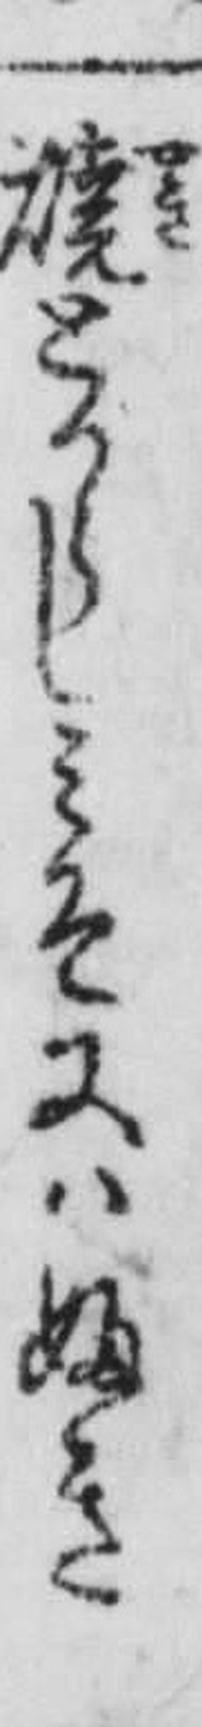焼とからしみそ又はふき
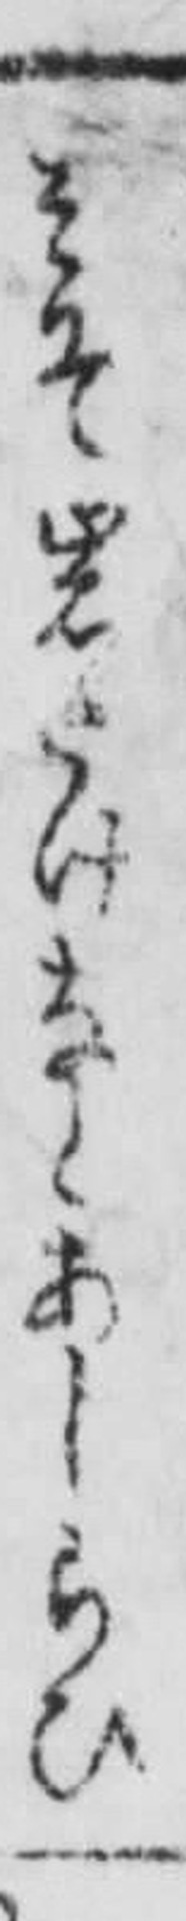みそ岩たけなとあしらひ
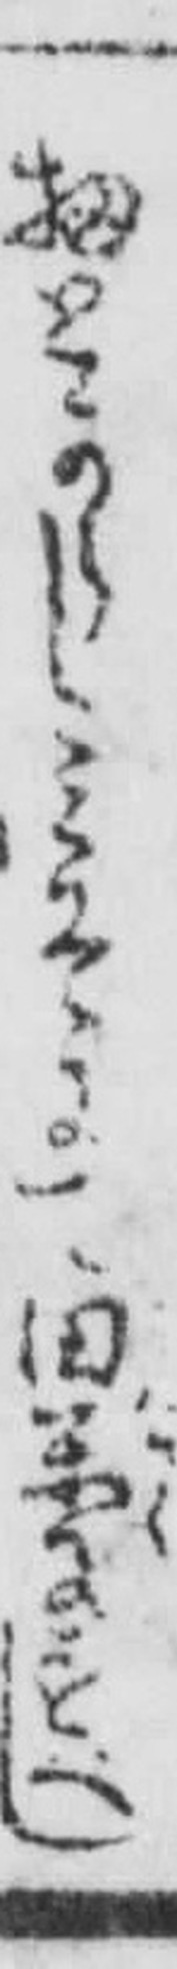扨とからしみそにて田楽にすべし
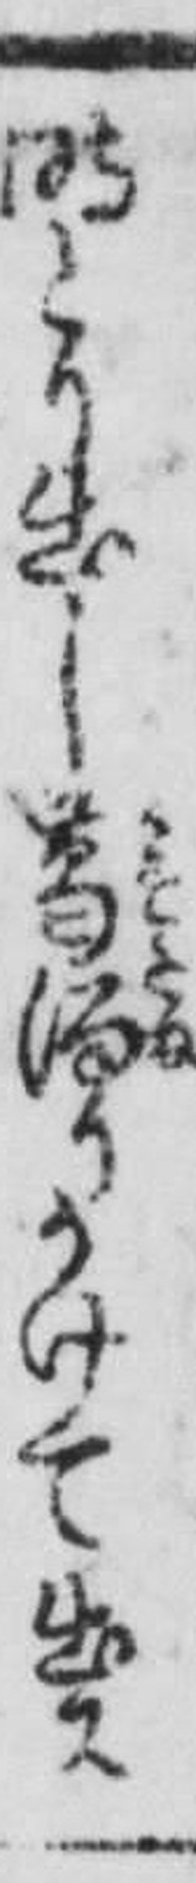時とり出し葛溜りかけて出す
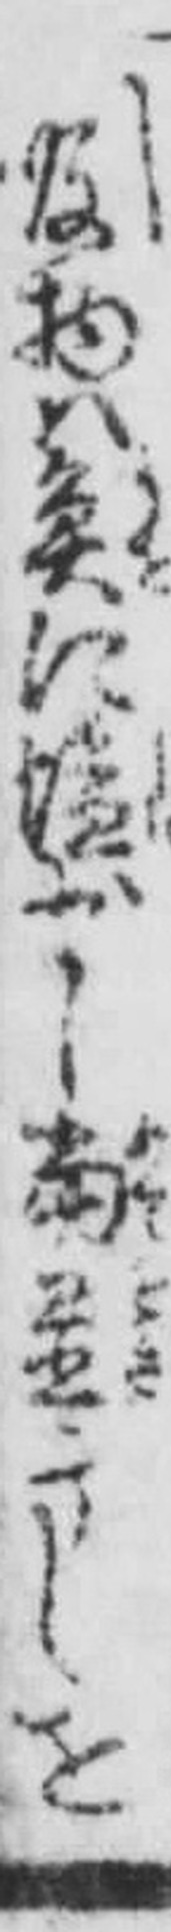吸物は魚に塩少し当置しを
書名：精進魚類間合料理/早速庖丁
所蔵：大阪府立大学学術情報センター 国文学研究資料館
